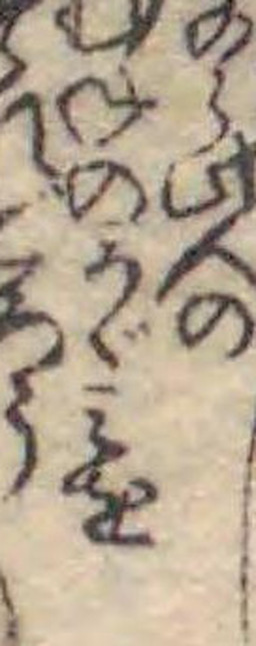むねのかゞみを
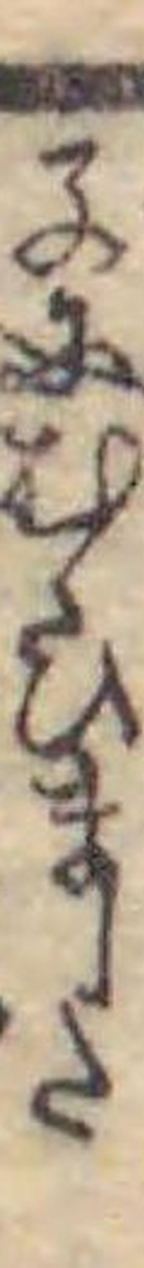子にむくひました
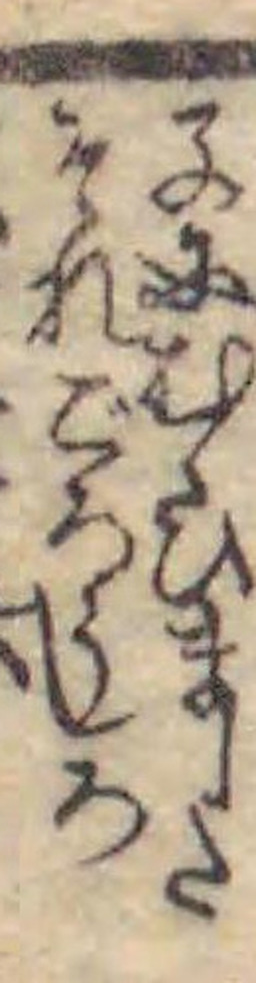それごろうしろ
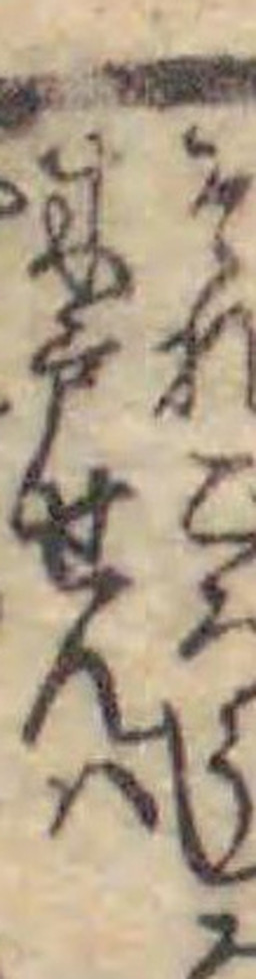木戸せんは

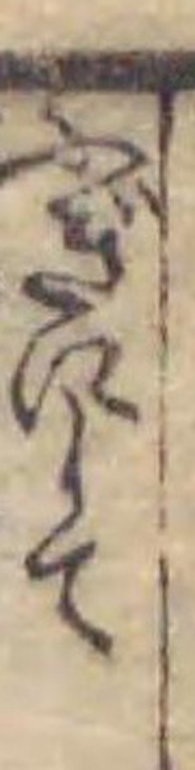ふぎにして
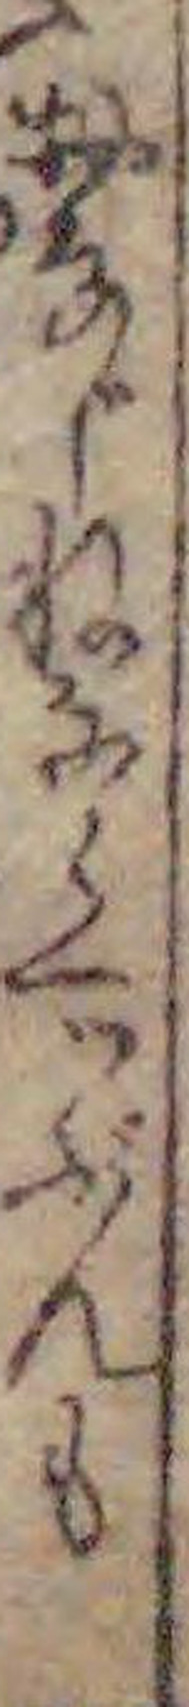おなじねなら一つぶんも
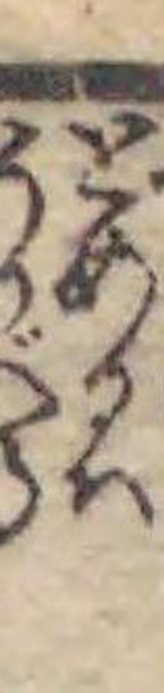うかべる
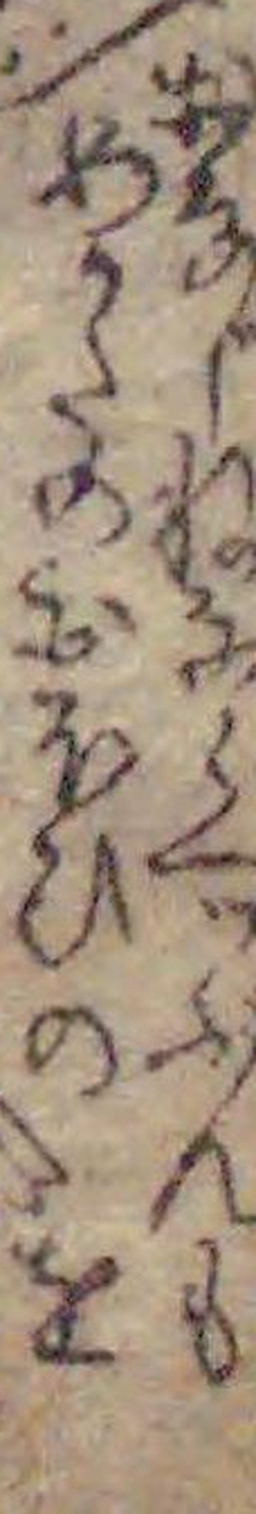めかたのおほいのを
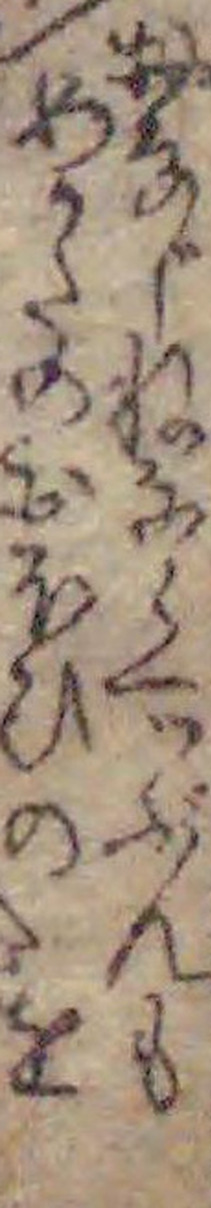めかたのおほいのを
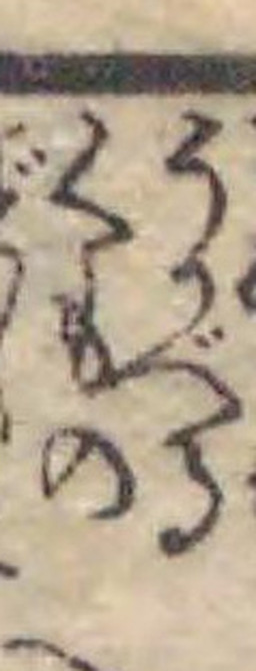くもの
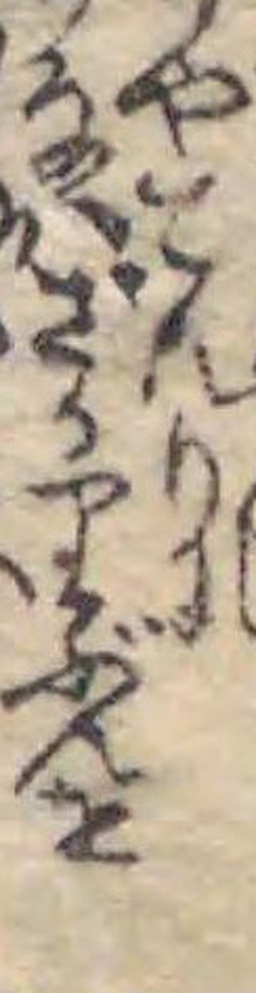かなはざるりぶんを
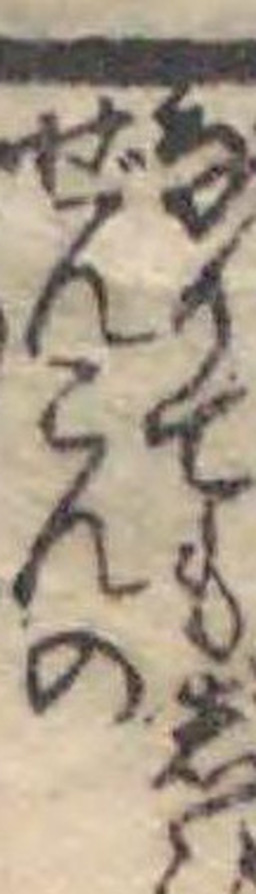ぜんこんの
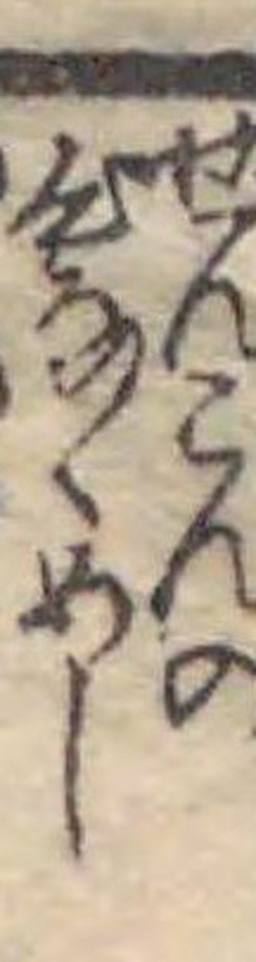心なくめし
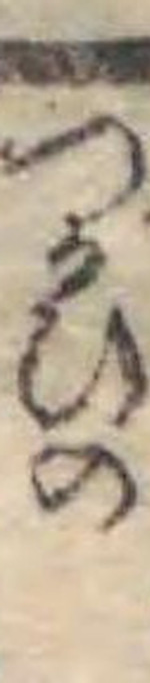つかひの
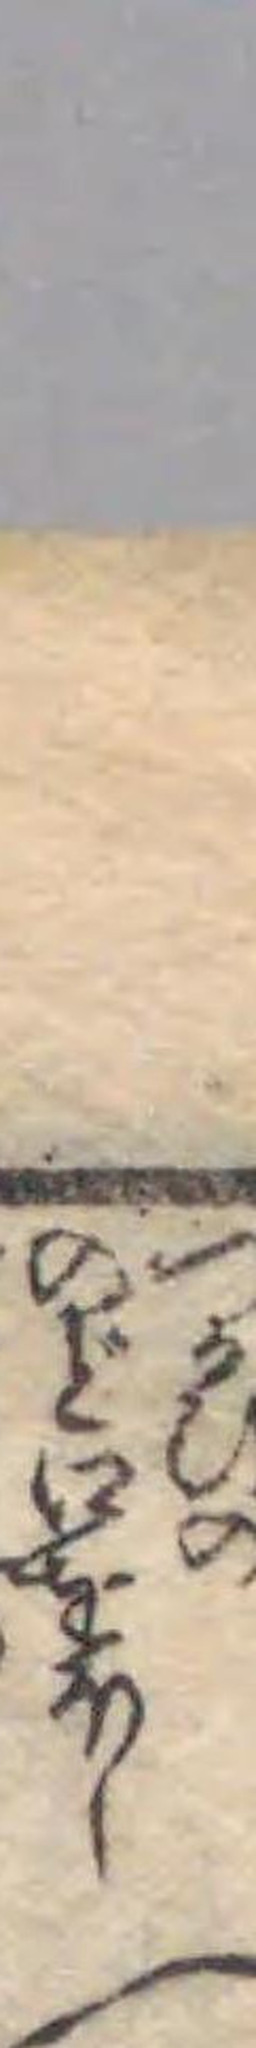のど口をほし
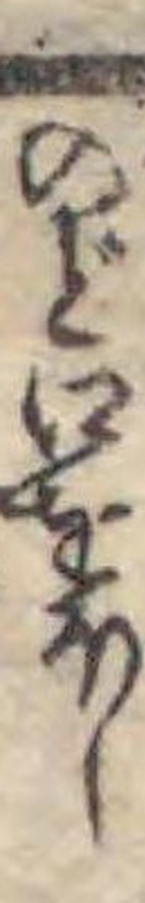のど口をほし
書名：人心鏡写絵 : 3巻
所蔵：国立国会図書館 National Diet Library, JAPAN
